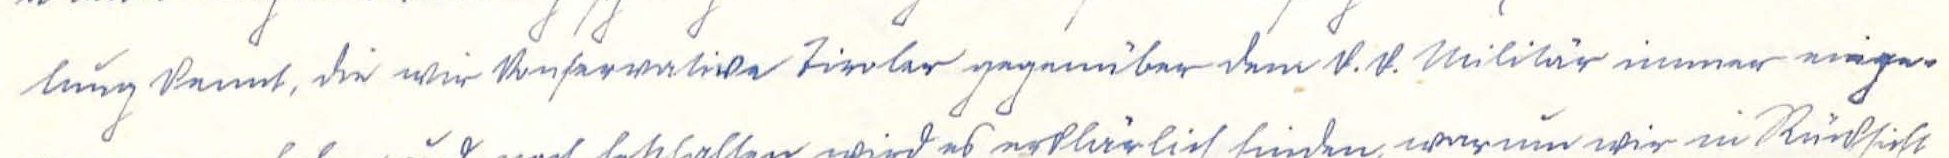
lung kennr, die wir konservativen Tiroler gegenüber dem k.k. Militär immer einge-
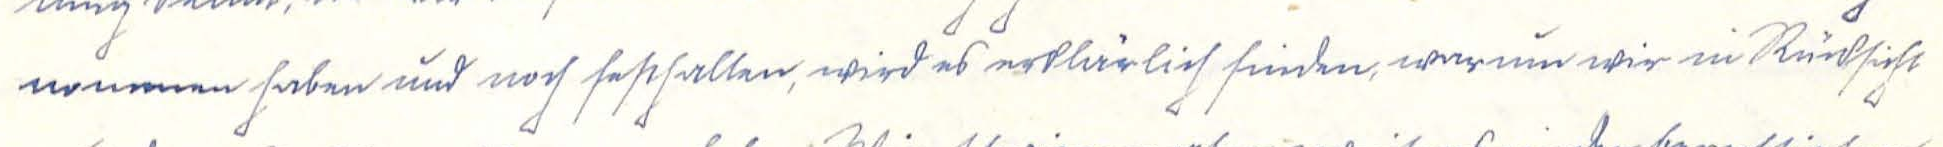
nommen haben und noch festhalten, wird es erklärlich finden, warum wir in Rücksicht
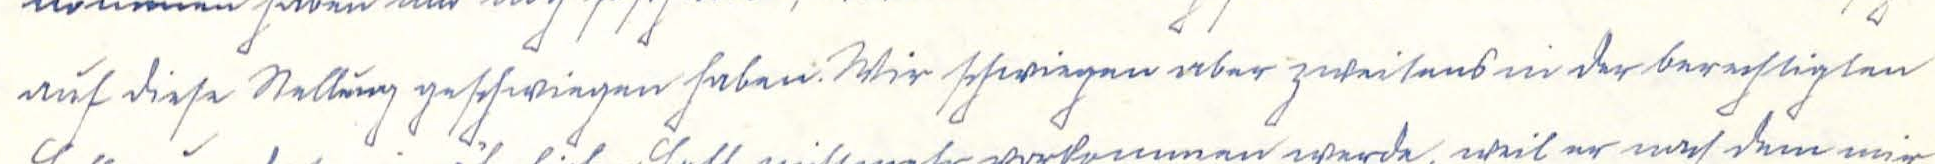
auf diese Stellung geschwiegen haben. Wir schwiegen aber zweitens in der berechtigten
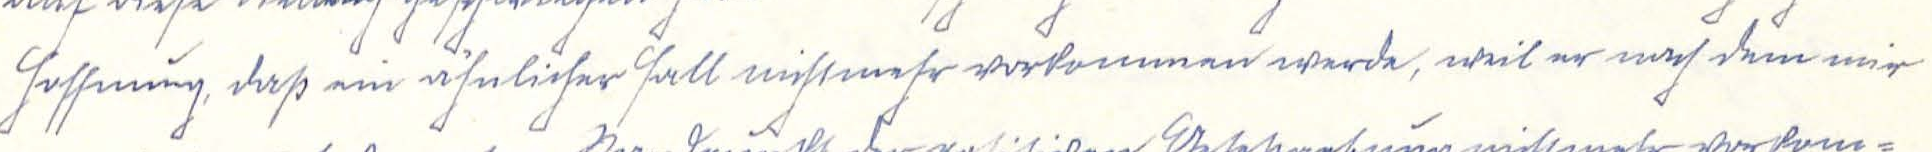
Hoffnung, daß ein ähnlicher Fall nichtmehr vorkommen werde, weil er nach dem mir
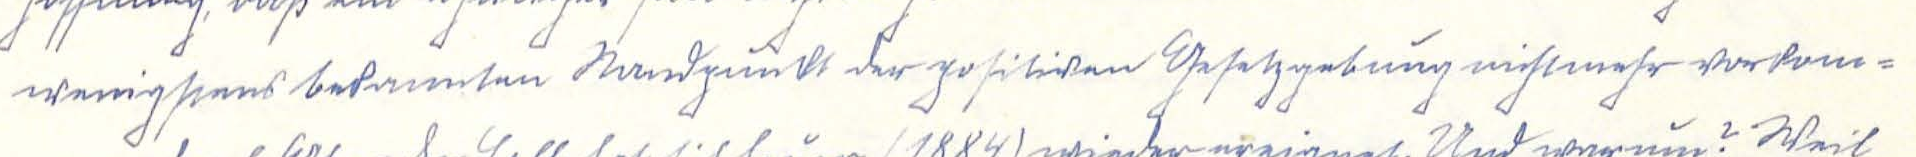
wenigstens bekannten Standpunkt der politischen Gesetzgebung nichtmehr vorkom-
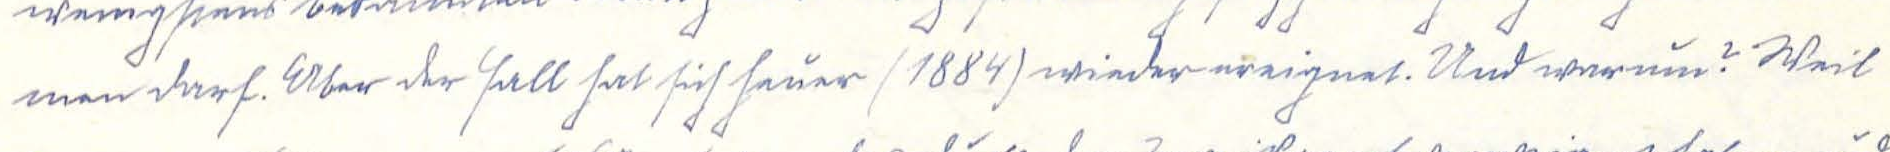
men darf. Aber der Fall hat sich heuer (1884) wieder ereignet. Und warum? Weil
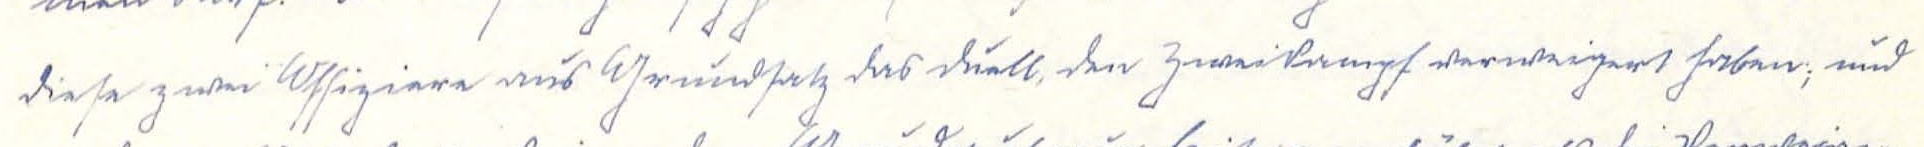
diese zwei Offiziere als Grundsatz das Duell, den Zweikampf verweigert haben; und
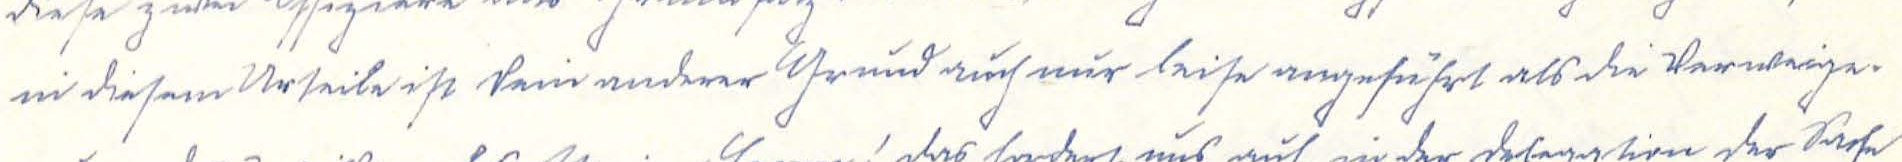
in diesem Urteile ist kein anderer Grund auch nur leise angeführt als die Verweige-
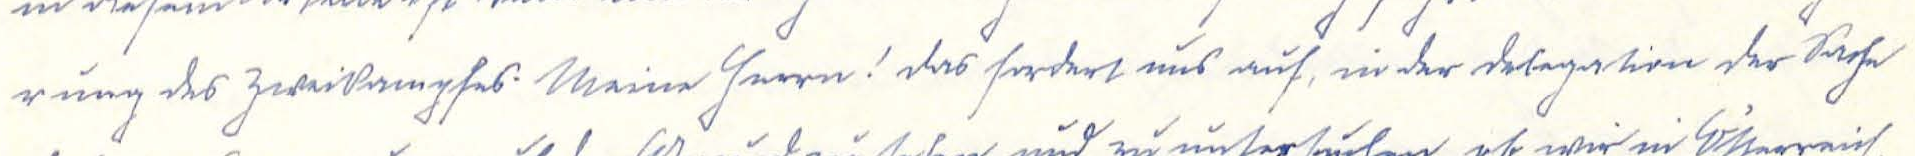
rung des Zweikampfes. Meine Herren! Das fordert uns auf, in der Delegation der Sache
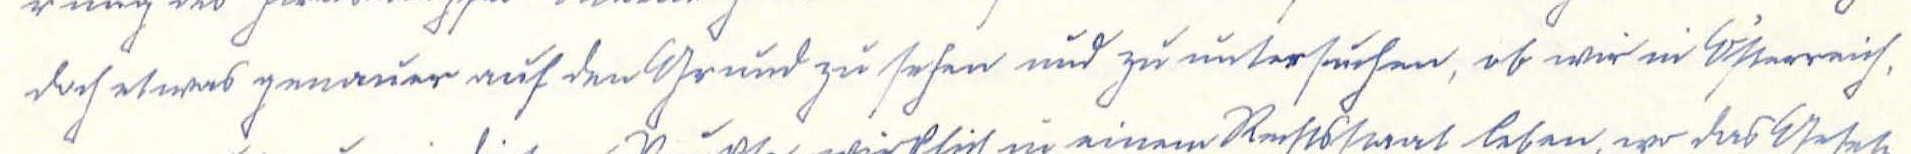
doch etwas genauer auf den Grund zu gehen und zu untersuchen, ob wir in Österreich,
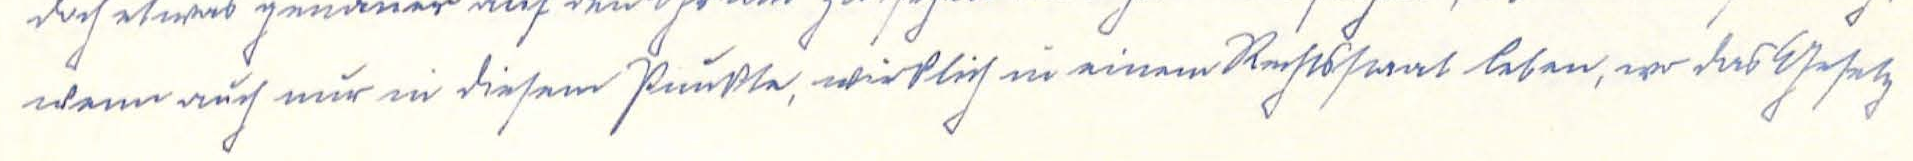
wenn auch nur in diesem Punkte, wirklich in einem Rechtsstaat leben, wo das Gesetz
